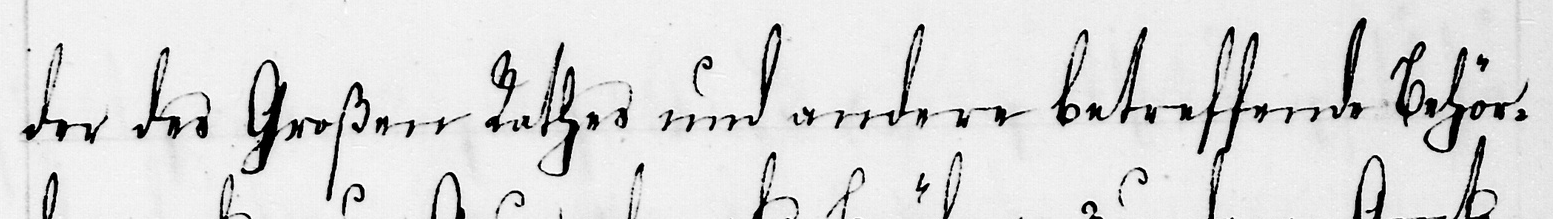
der des Großen Rathes und andere betreffende Behör¬
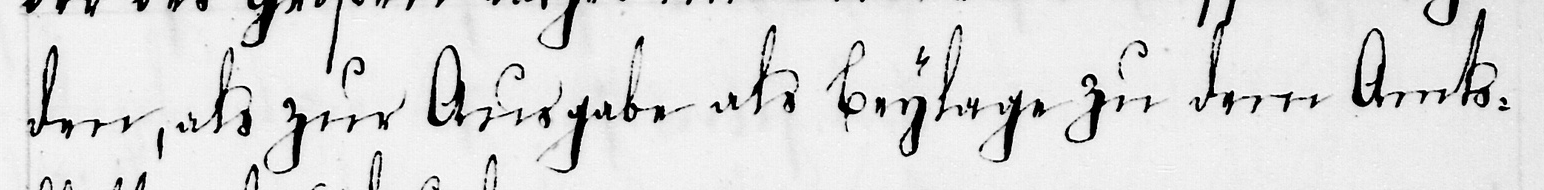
den, als zur Ausgabe als Beylage zu dem Amts¬
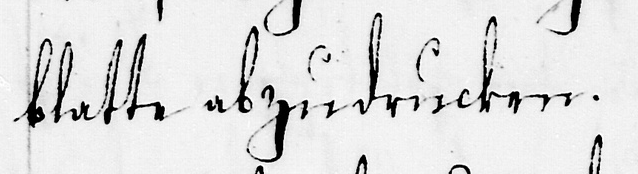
blatte abzudrucken.
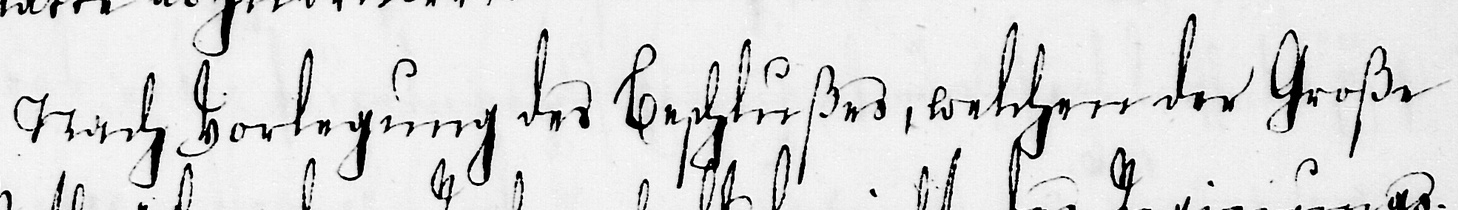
Nach Vorlegung des Beschlußes, welchen der Große
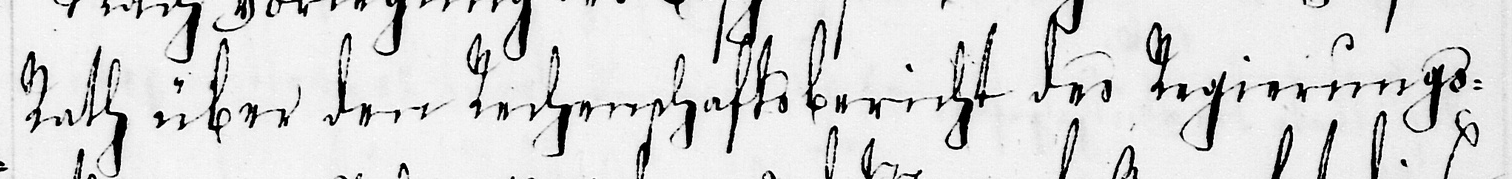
Rath über den Rechenschaftsbericht des Regierungs¬
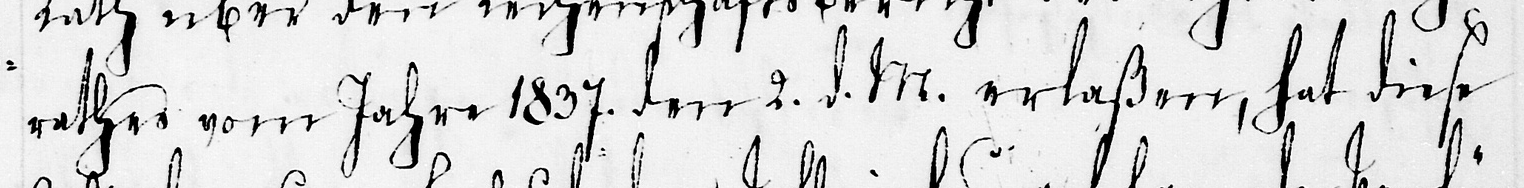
rathes vom Jahre 1837. den 2. d. M. erlaßen, hat diese
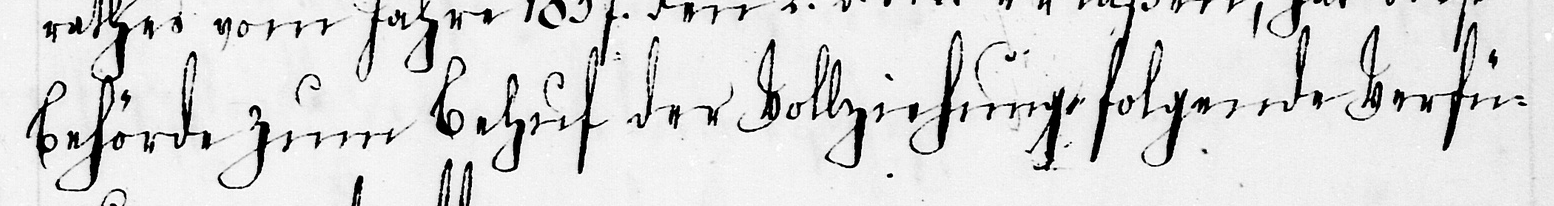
Behörde zum Behuf der Vollziehung folgende Verfü¬
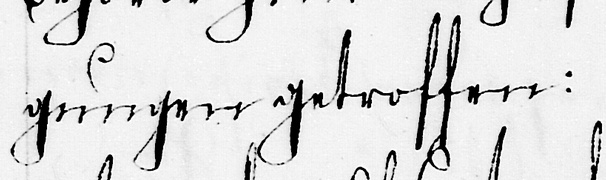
gungen getroffen:
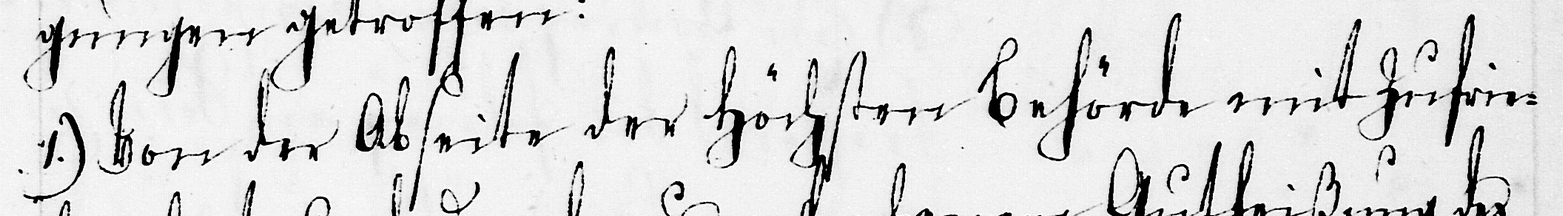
1.) Von der Abseite der Höchsten Behörde mit Zufrie¬
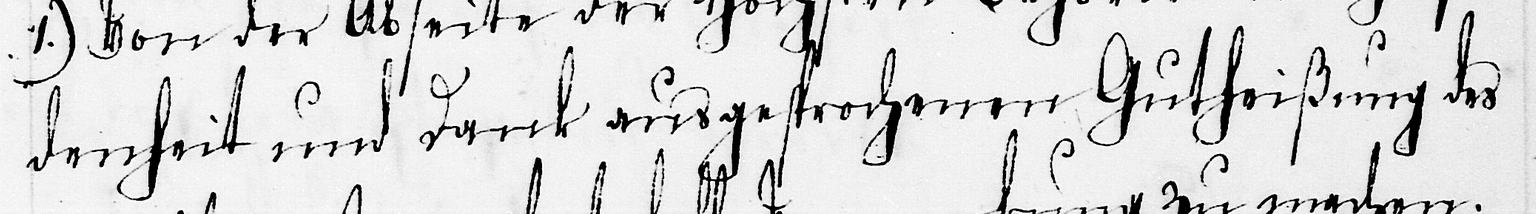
denheit und Dank ausgesprochenen Gutheißung des
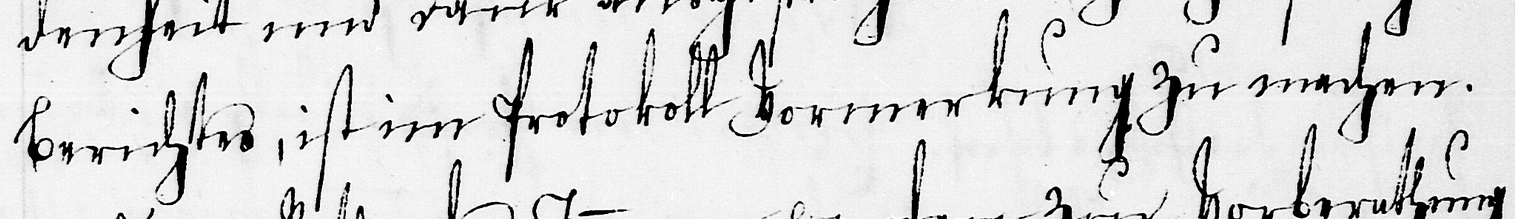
Berichtes, ist im Protokoll Vormerkung zu machen.
